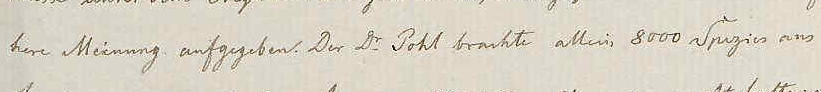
here Meinung aufgegeben. Der Dr Pohl brachte allein 8000 Spezies aus
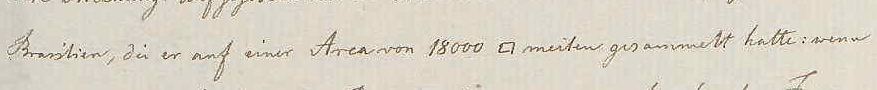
Brasilien, die er auf einer Area von 18000 □ meilen gesammelt hatte: wenn
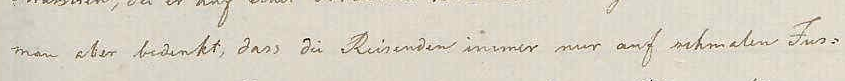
man aber bedenkt, dass die Reisenden immer nur auf schmalen Fus-
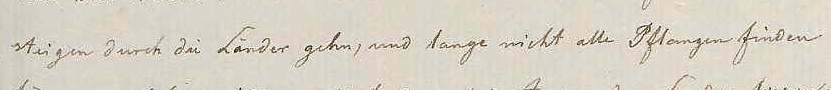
steigen durch die Länder gehn, und lange nicht alle Pflanzen finden
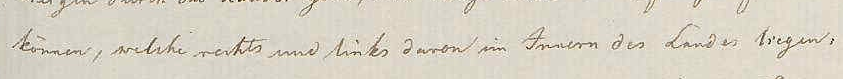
können, welche rechts und links davon im Innern des Landes liegen,
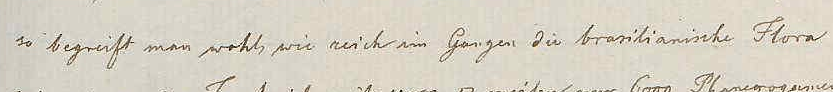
so begreift man wohl, wie reich im Ganzen die brasilianische Flora
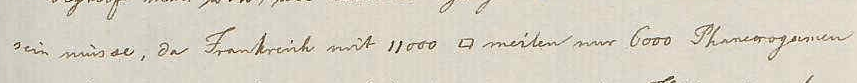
sein müsse, da Frankreich mit 11000 □ meilen nur 6000 Phanerogamen
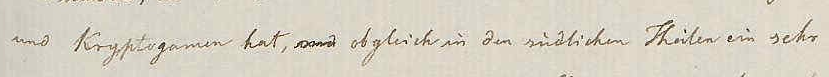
und Kryptogamen hat, und obgleich in den südlichen Theilen ein sehr
